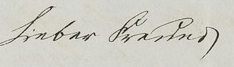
Lieber Freund,
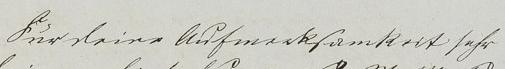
Für deine Aufmerksamkeit sehr
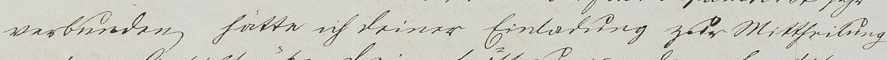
verbunden, hätte ich deiner Einladung zur Mittheilung
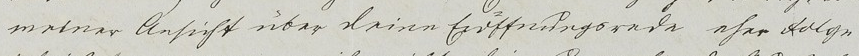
meiner Ansicht über deine Eröffnungsrede eher Folge
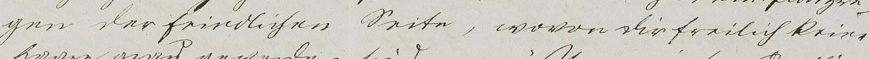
gen der feindlichen Seite, wovon dir freilich keine
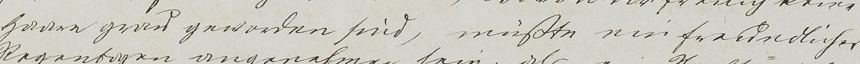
Haare grau geworden sind, müßte ein freundlicher
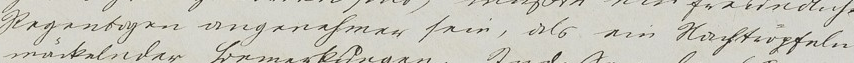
Regenbogen angenehmer sein, als ein Nachtröpfeln
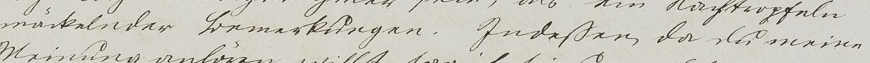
mäckelnder Bemerkungen. Indessen da du meine
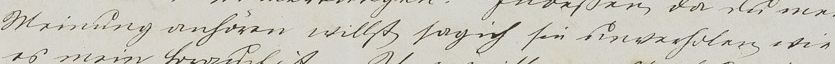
Meinung anhören willst, sag ich sie unverholen wie
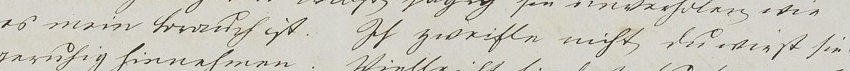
es mein Brauch ist. Ich zweifle nicht, du wirst sie
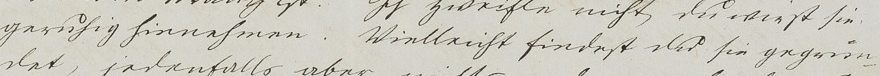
geruhig hinnehmen. Vielleicht findest du sie gegrün-
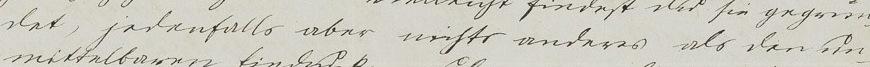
det, jedenfalls aber nichts anderes als den un-
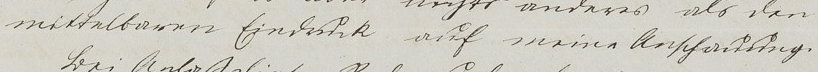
mittelbaren Eindruck auf meine Anschauung.
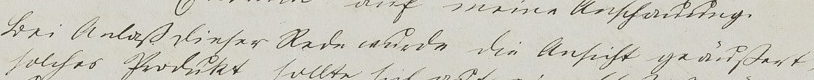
Bei Anlaß dieser Rede wurde die Ansicht geäußert,
